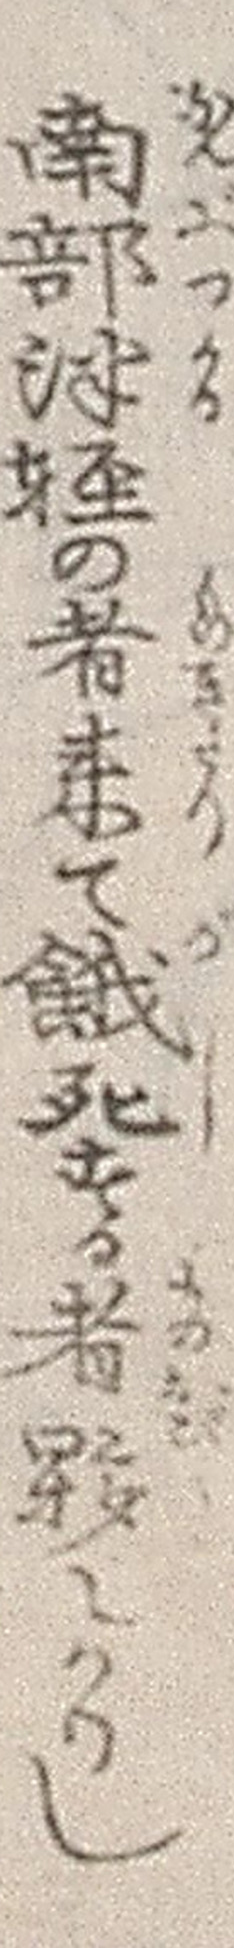南部津軽の者来て餓死する者夥しかりし
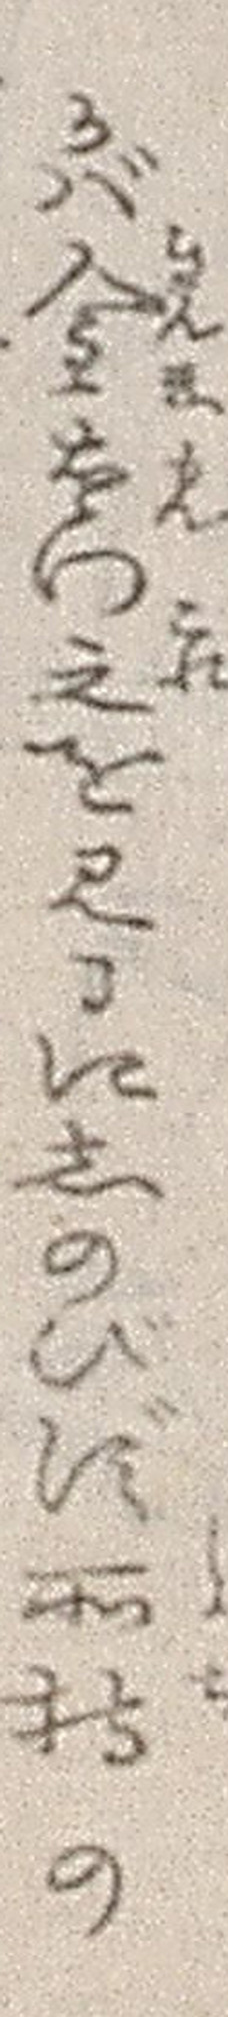かば金右衛門之を見るにしのびず所持の
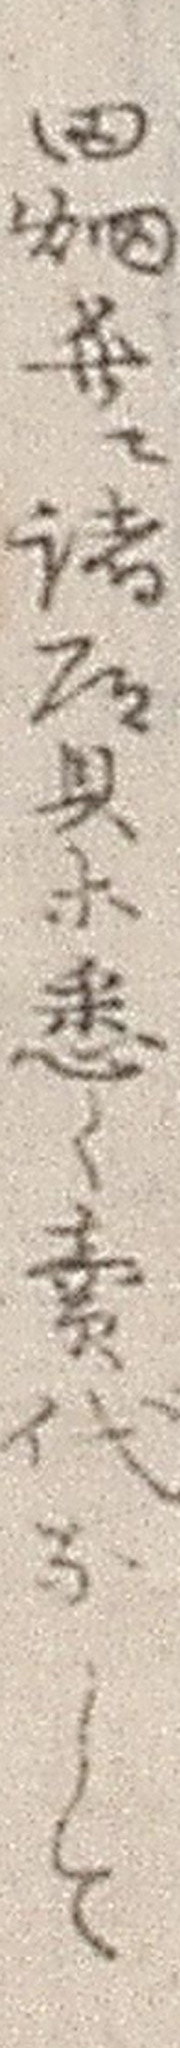田畑并ニ諸道具等悉く売代なして
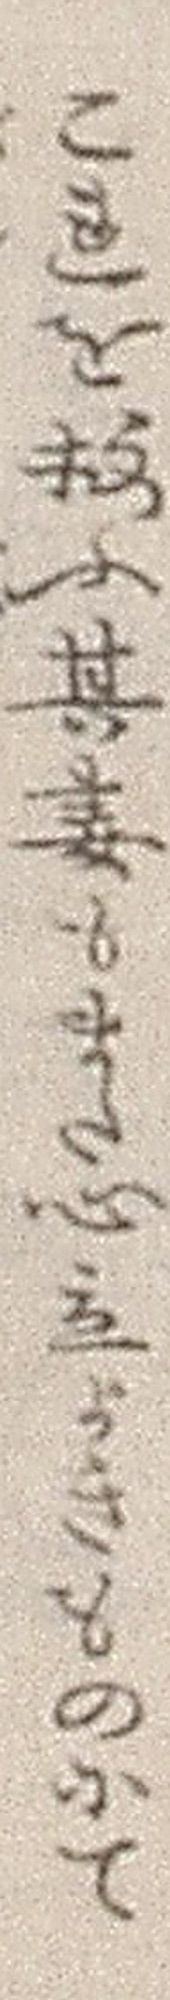これを救ふ其妻もまた心立よきものにて
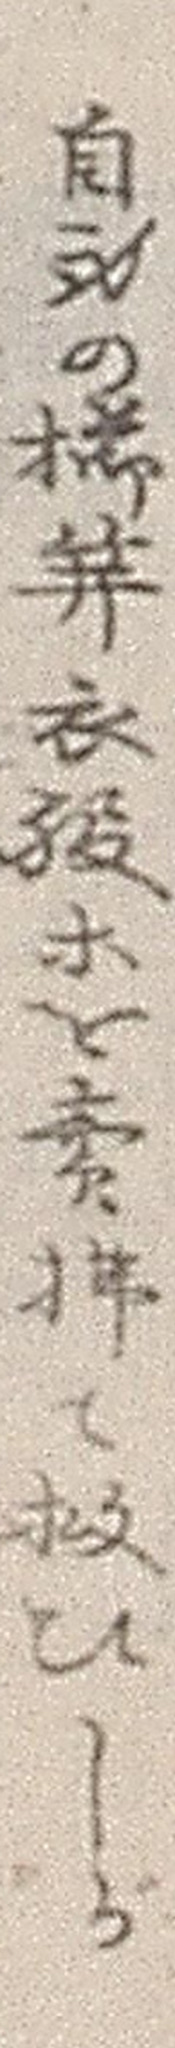自身の櫛笄衣服等を売払て救ひしが
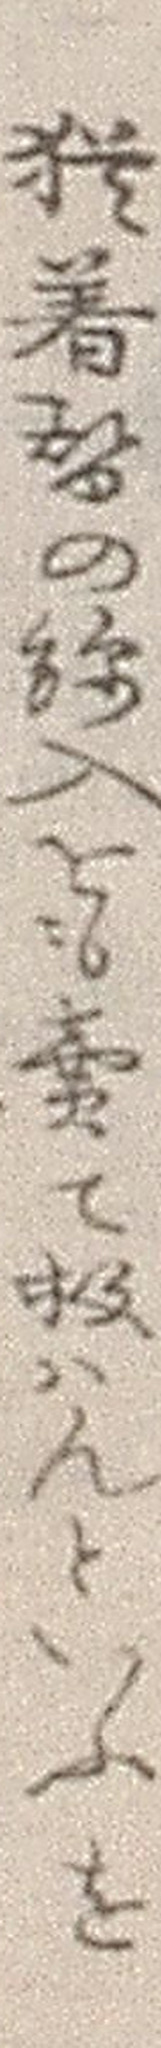猶着替の綿入をも売て救はんといふを
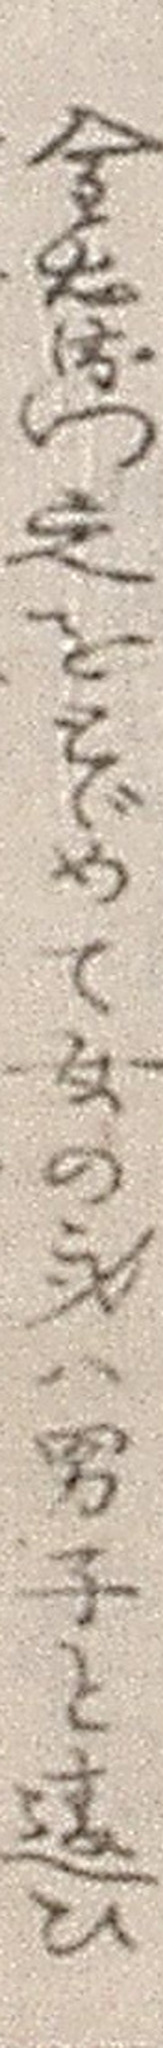金右衛門之をとゞめて女の身は男子と違ひ
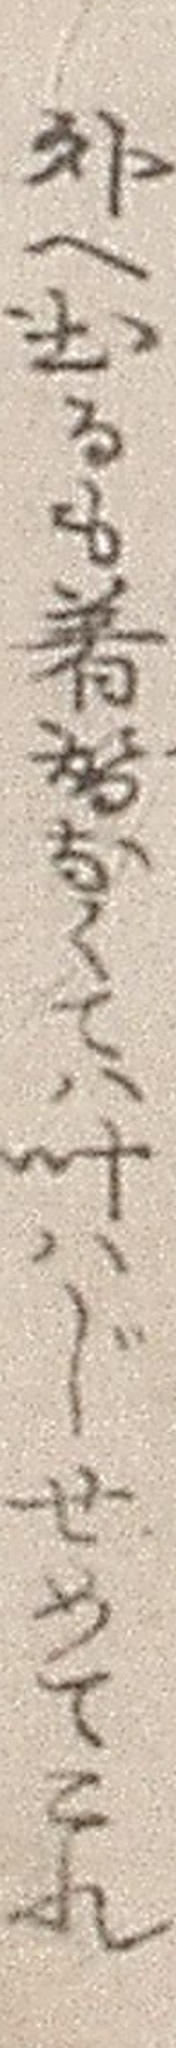外へ出るも着替なくては叶はじせめてこれ
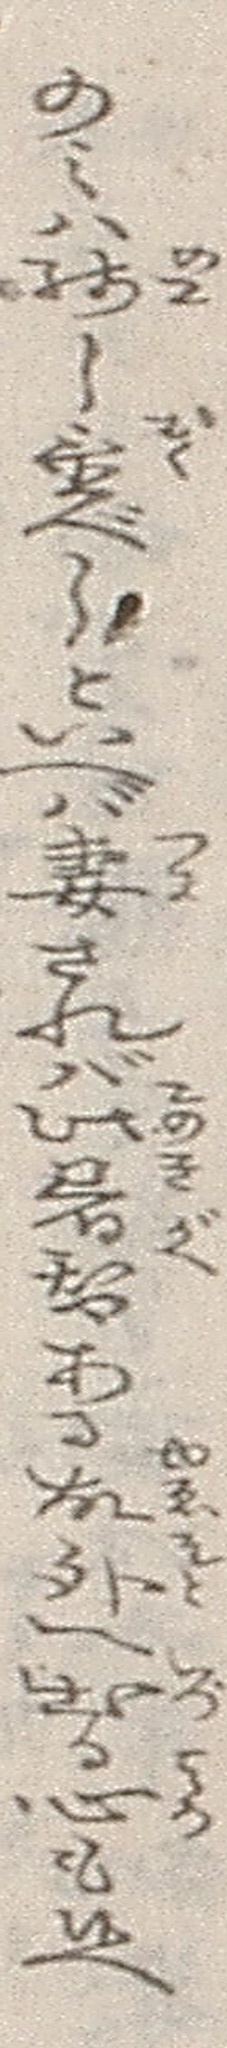のみは残し置べしといへば妻されば此着替ある故外へ出る心も候へ
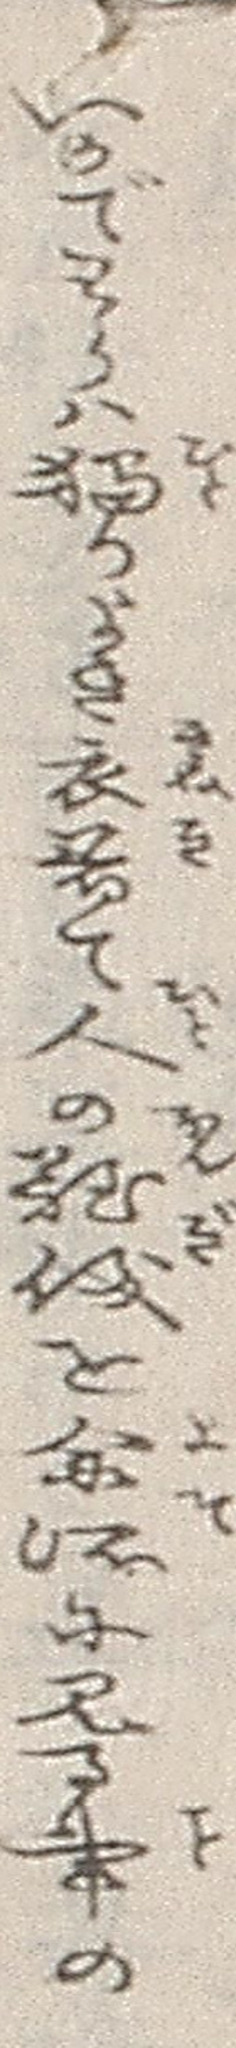いかでわらは独りよき衣着て人の難儀を余所に見る事の
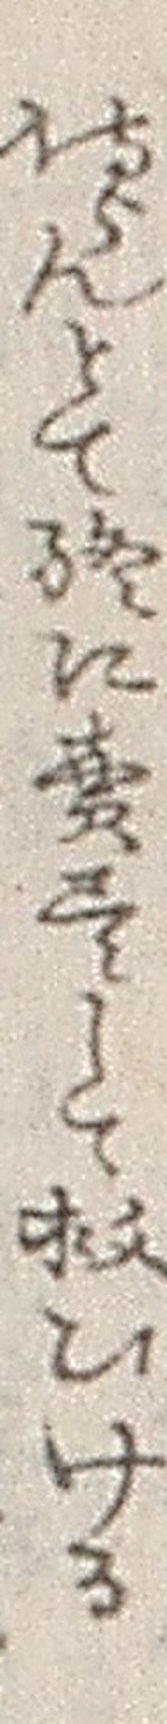侍らんとて終に売尽して救ひける
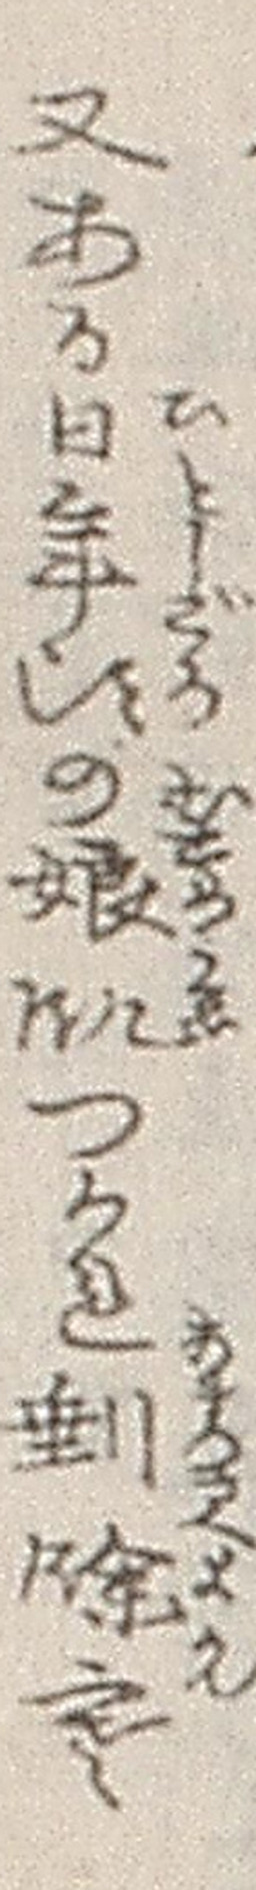又ある日年頃の娘飢つかれ剰余寒
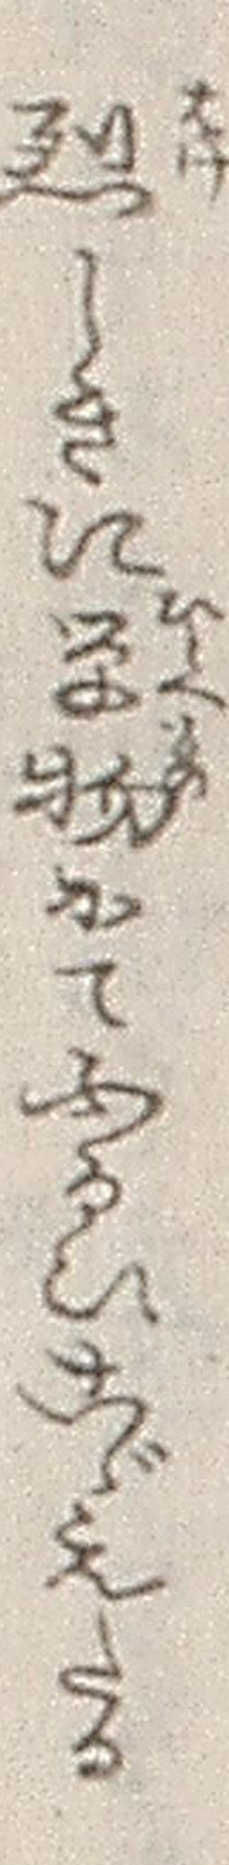烈しきに単物にてふるひこゞえたる
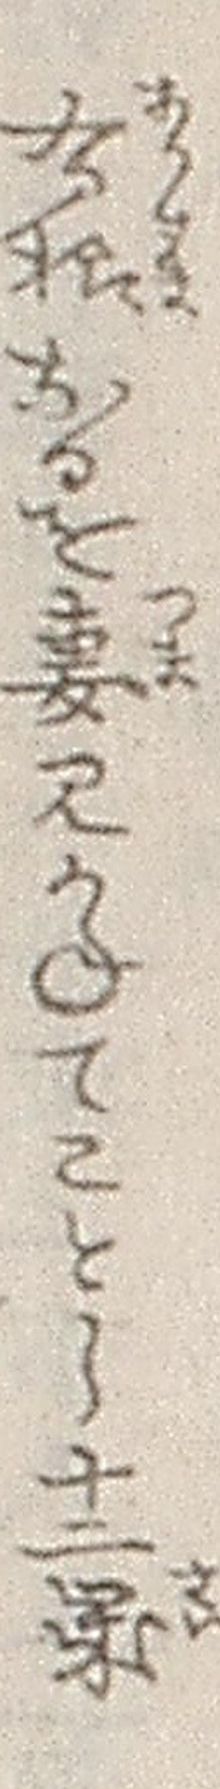有様なるを妻見かねてことし十二歳
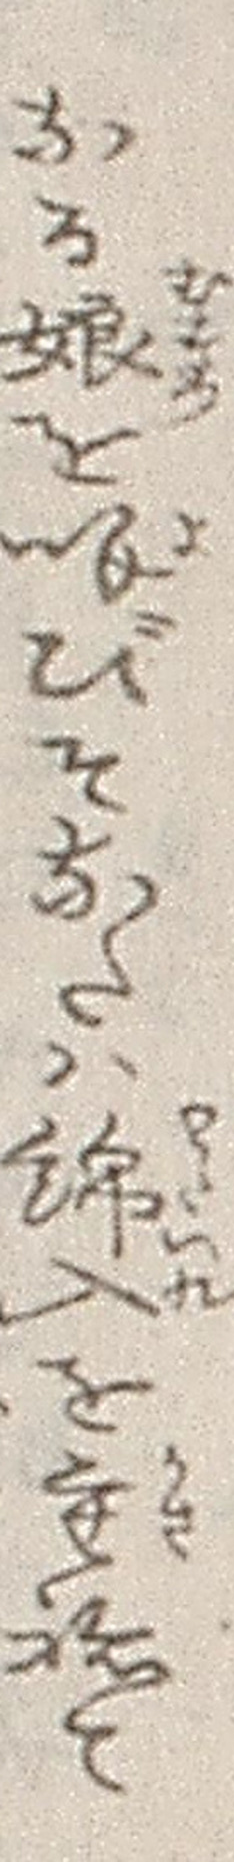なる娘を呼びそなたは綿入を重ねて
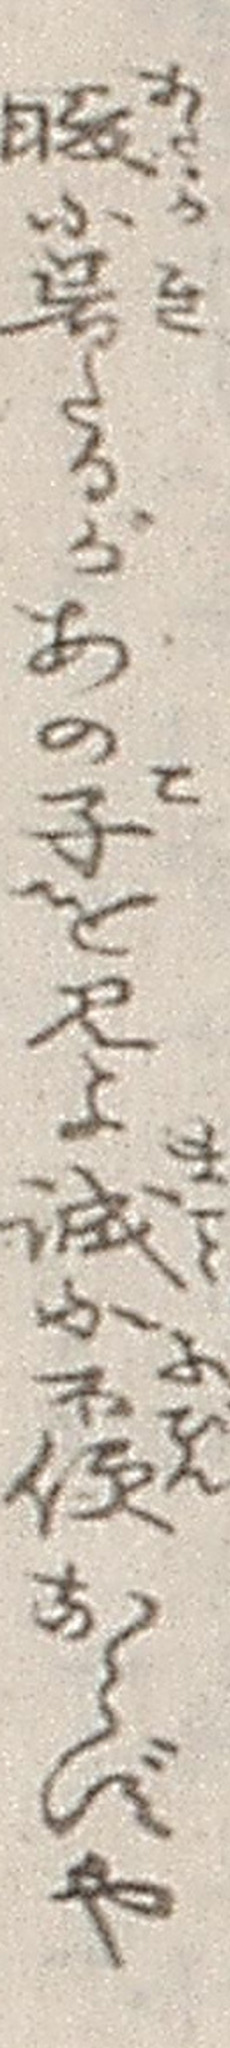暖に着たるがあの子を見よ誠に不便ならずや
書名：凶荒図録　完
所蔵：東京大学地震研究所図書室 Earthquake Research Institute Library, The University of Tokyo, JAPAN
